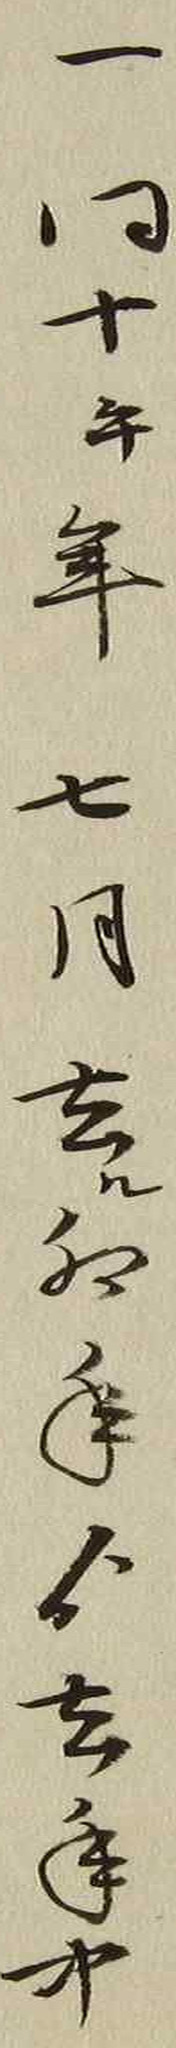一同十午年七月去ル卯年より去る年中
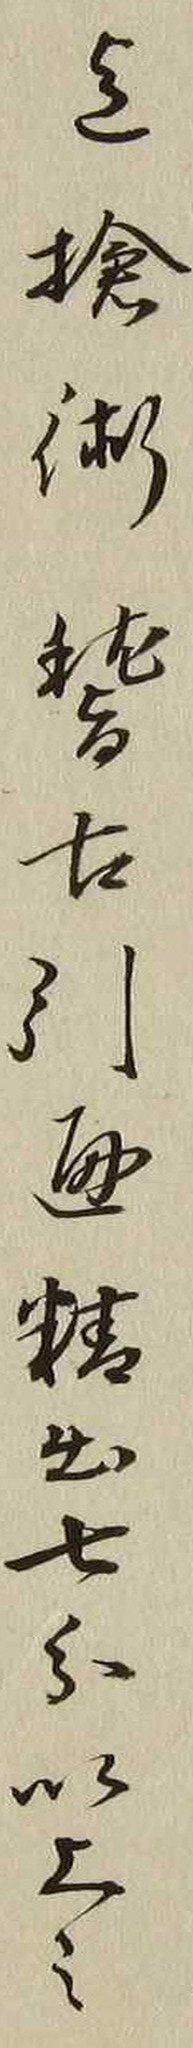迄槍術稽古引通し精出七分以上之
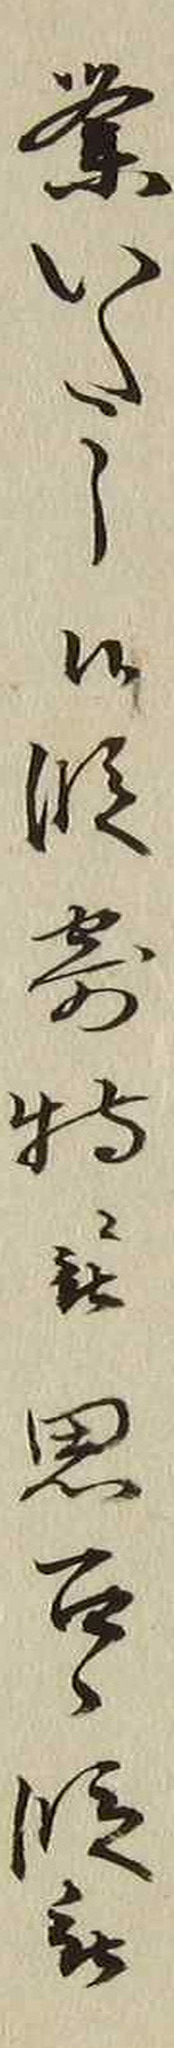業いたし候段奇特ニ思召し候段
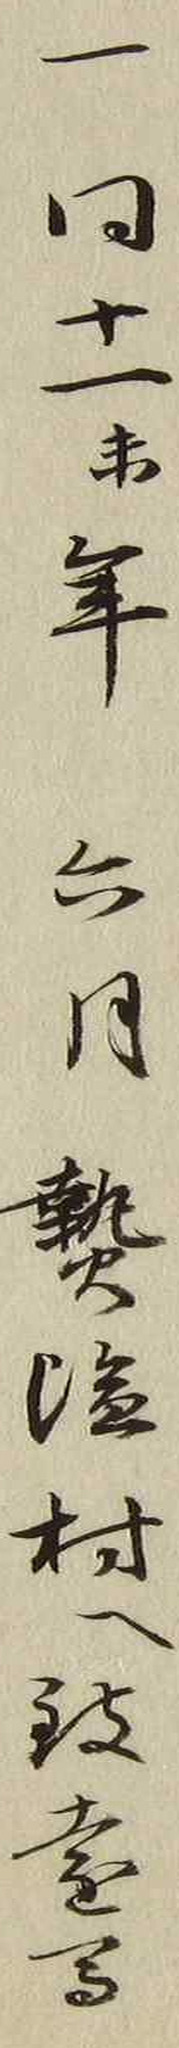一同十一未年六月熱塩村へ遠馬致し
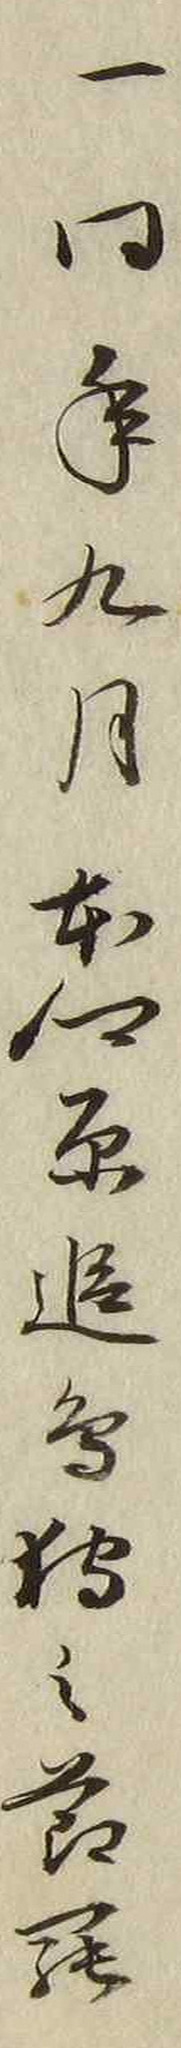一同年九月本郷原追鳥狩之節罷り

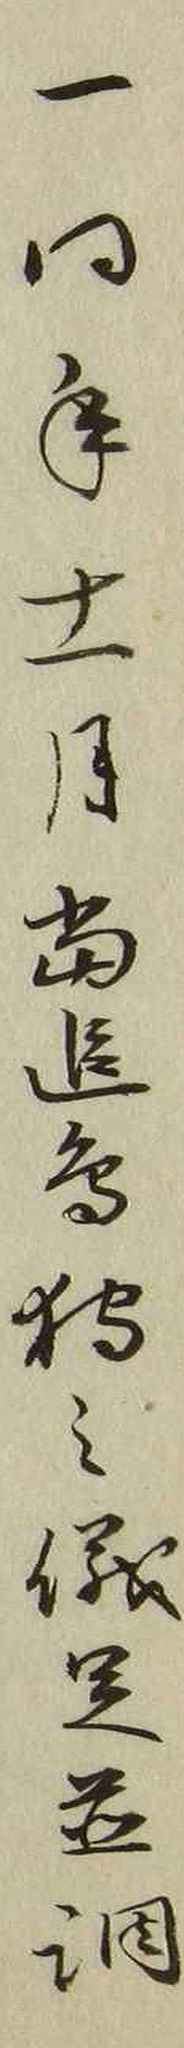一同年十一月当追鳥狩之儀足並調
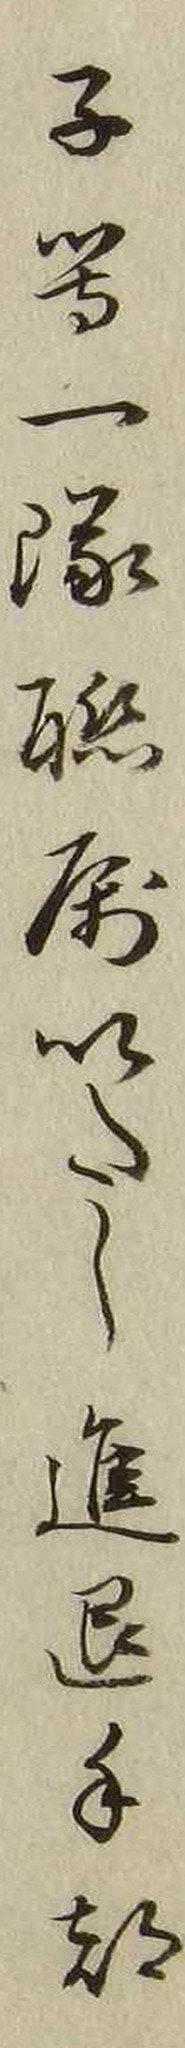子等一隊聯属いたし進退手都
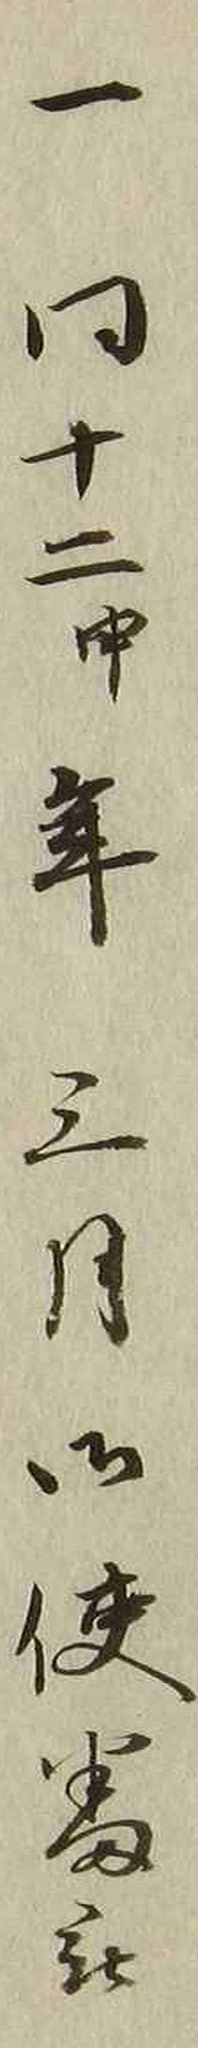一同十二申年三月御使い番
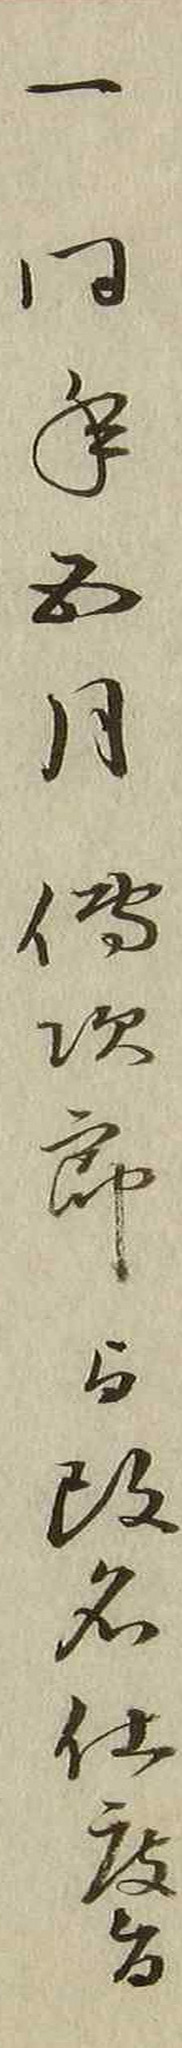一同年五月傳次郎と改名仕り度旨
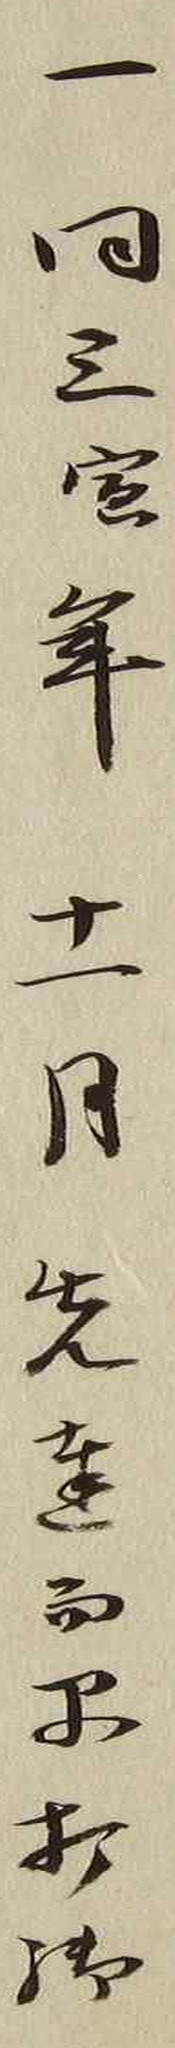一同三寅年十一先達早打御
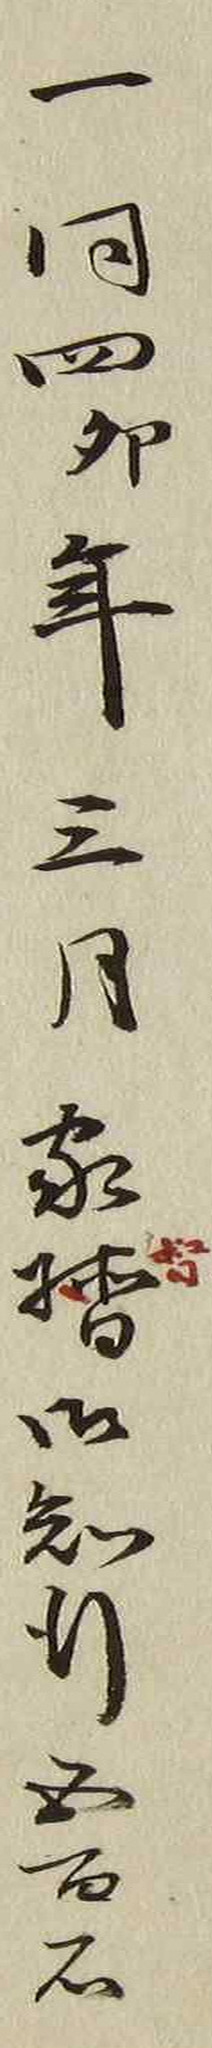一同四卯年三月家督御知行五百石
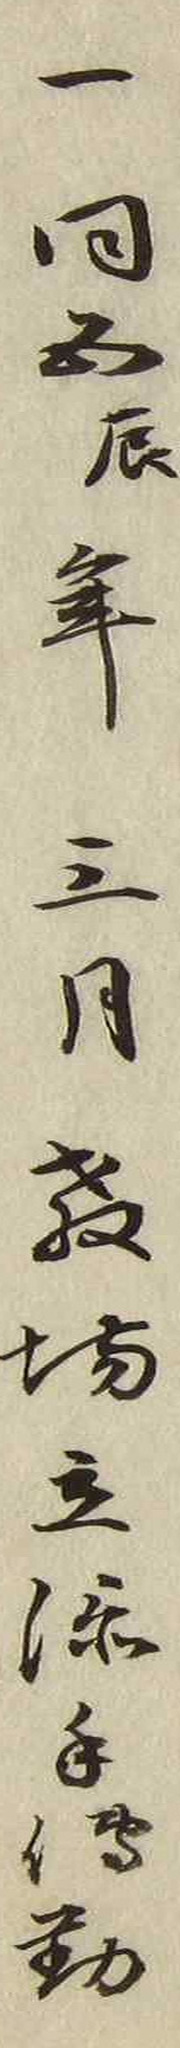一同五辰年三月教場立添え手伝い勤

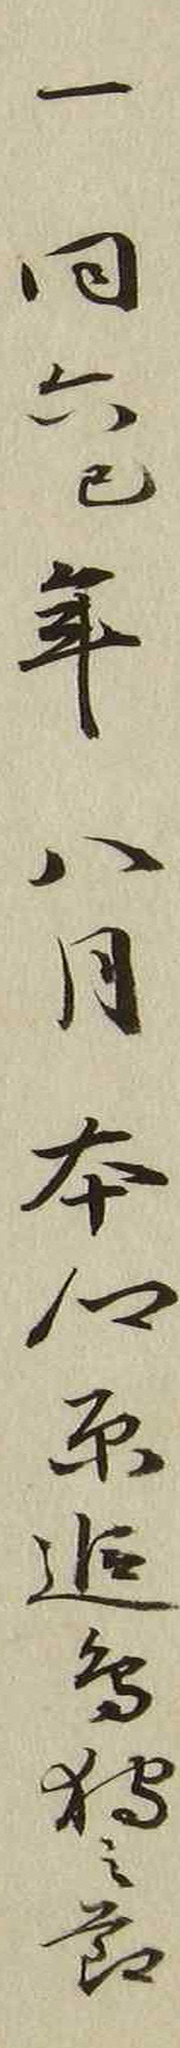一同六巳年八月本郷原追鳥狩之節
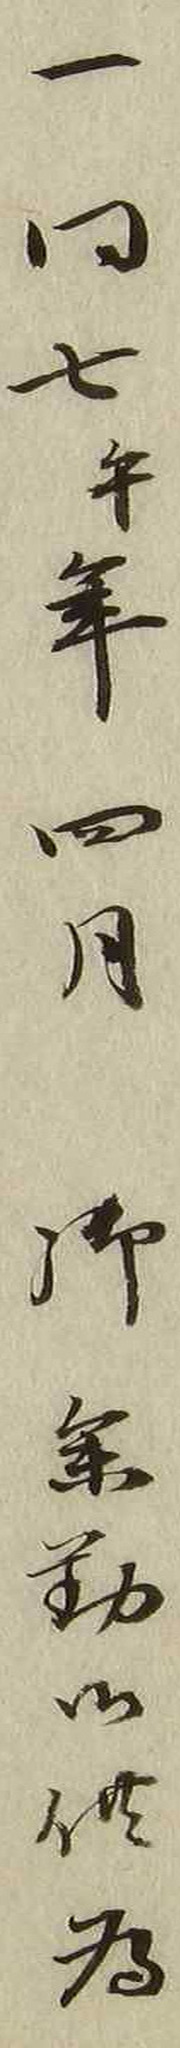一同七午年四御参勤御供
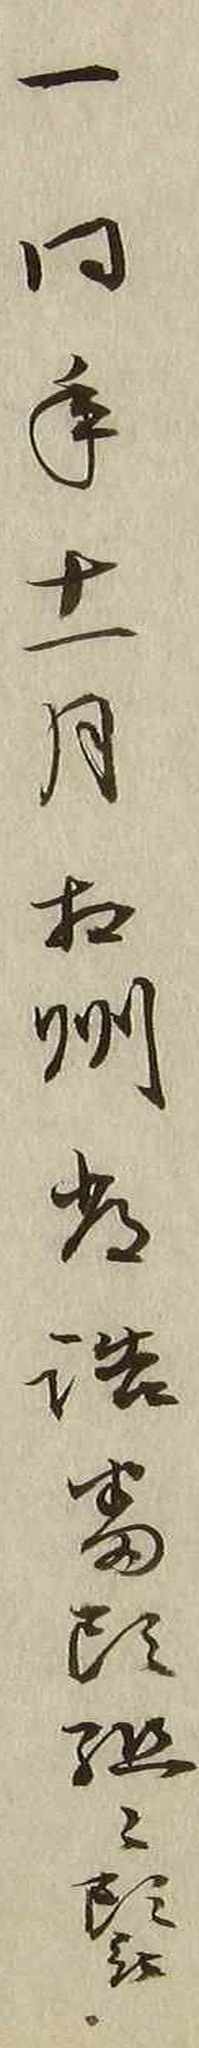一同年十一月相州常詰め番頭組ニ頭
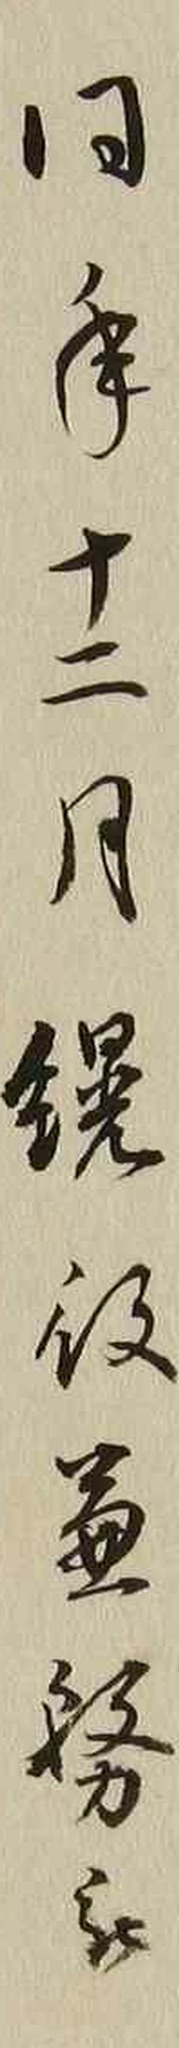一同年十二月幌役兼務
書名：諸士系譜　巻之16　い之部16
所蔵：会津若松市立会津図書館
